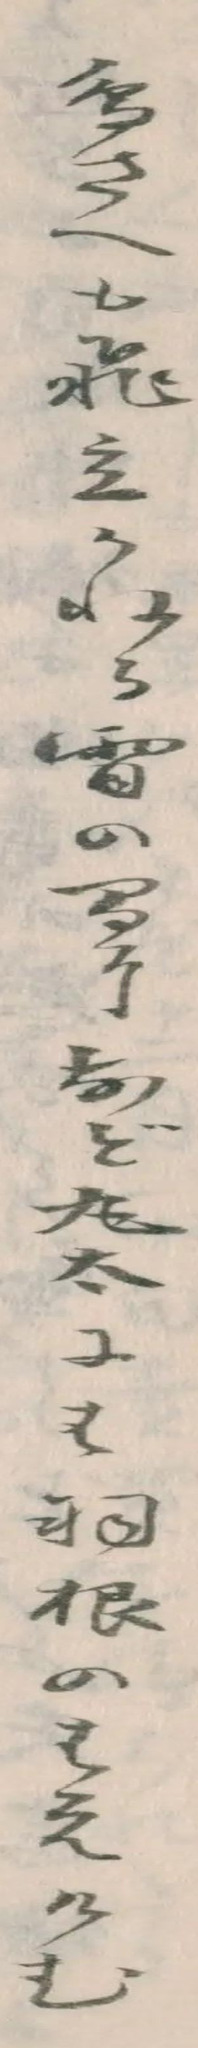鳥さへも飛立かねる雪の間になど丸太には羽根のはえけむ
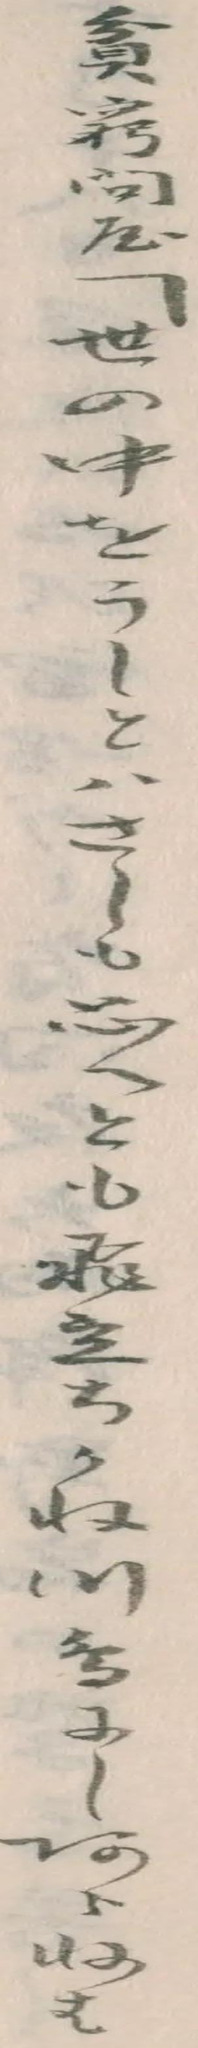貧窮問屋「世の中をうしとはさしも思へとも飛立ちかねつ鳥にしあらねは
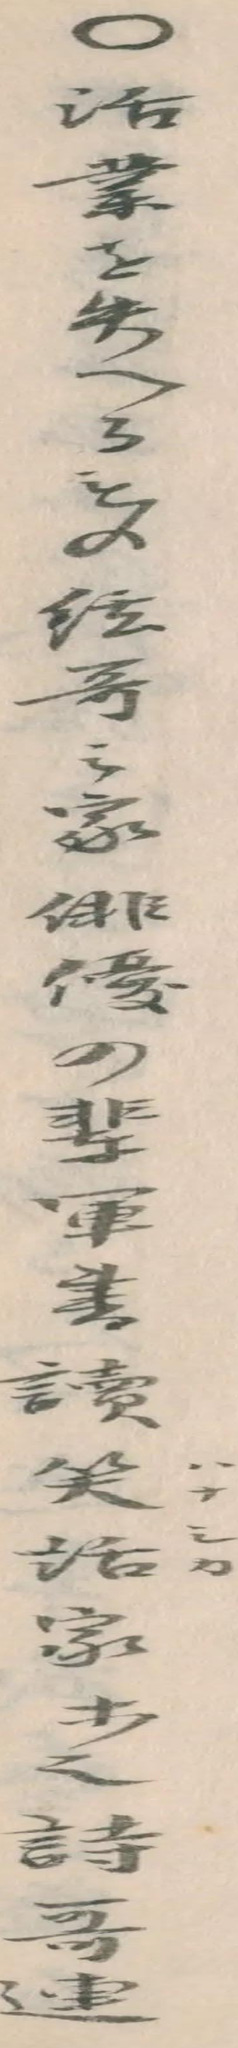〇活業を失へるもの絃哥之家俳優の輩軍書読笑話家等也哥連

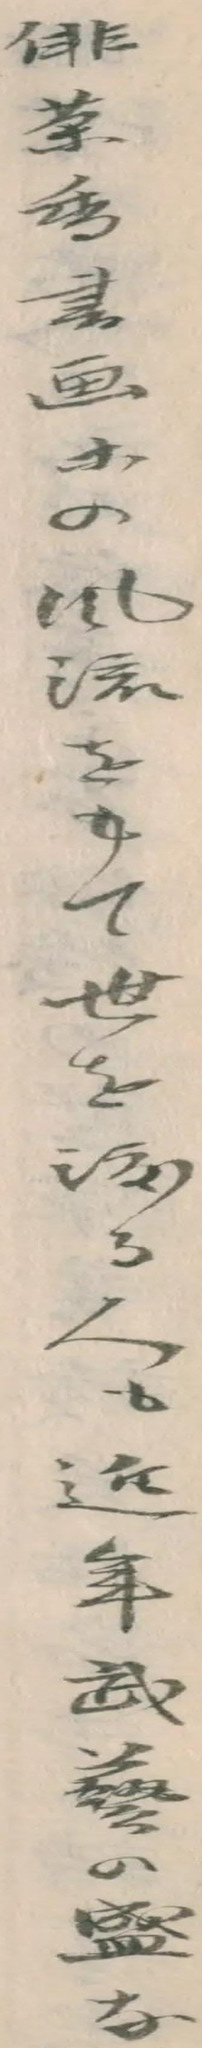俳茶香書画等の風流をもて世を渡る人も近年武芸の盛な
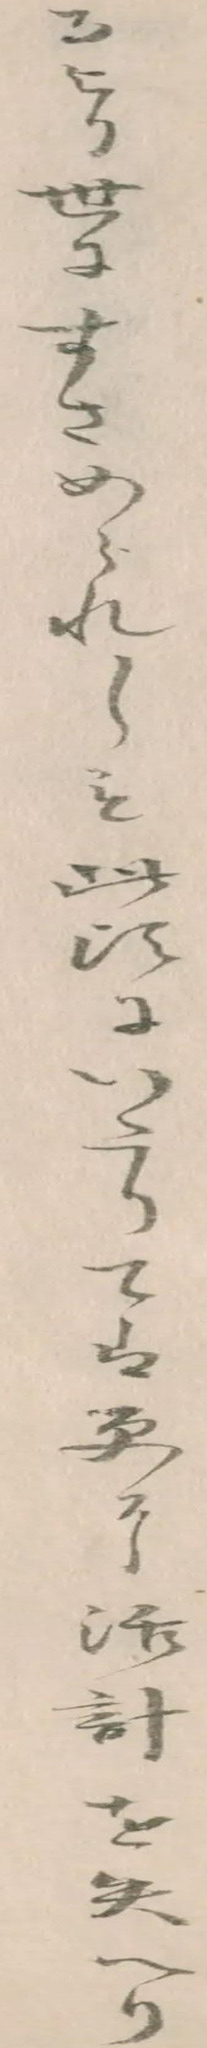るより世にすさめられしも此頃にいたりては更に活計を失へり
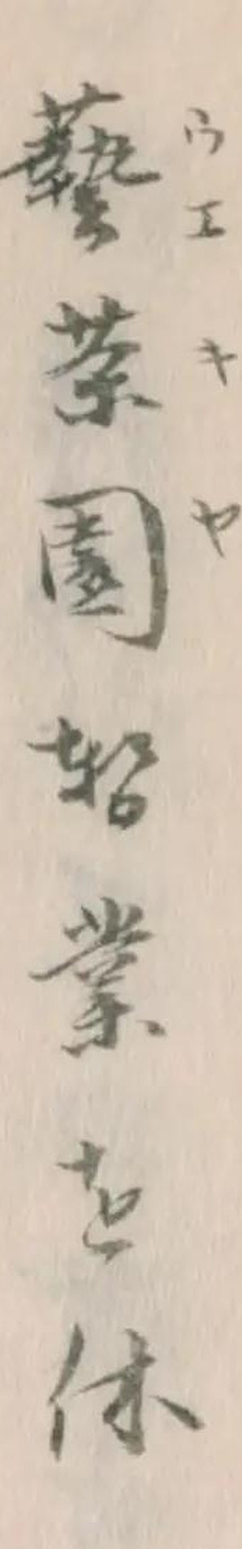芸茶園暫業を休
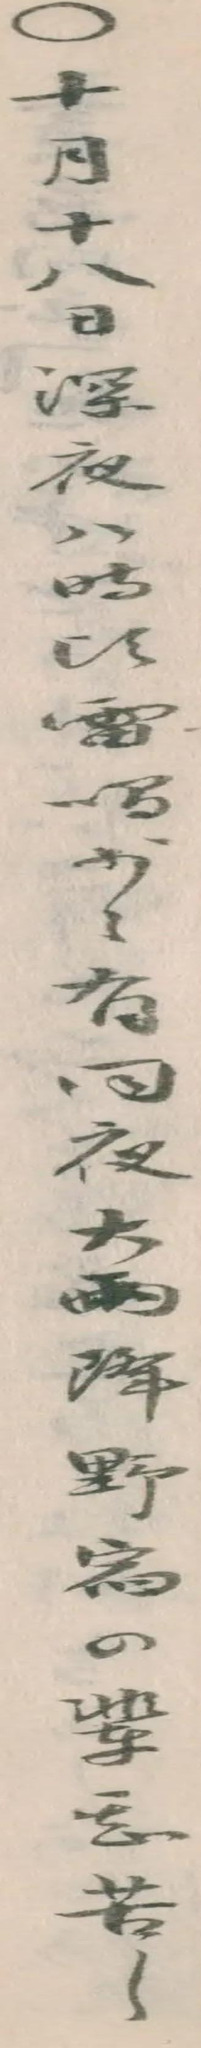〇十月十八日深夜八時頃雷鳴少し有同夜大雨降野宿の輩甚苦し
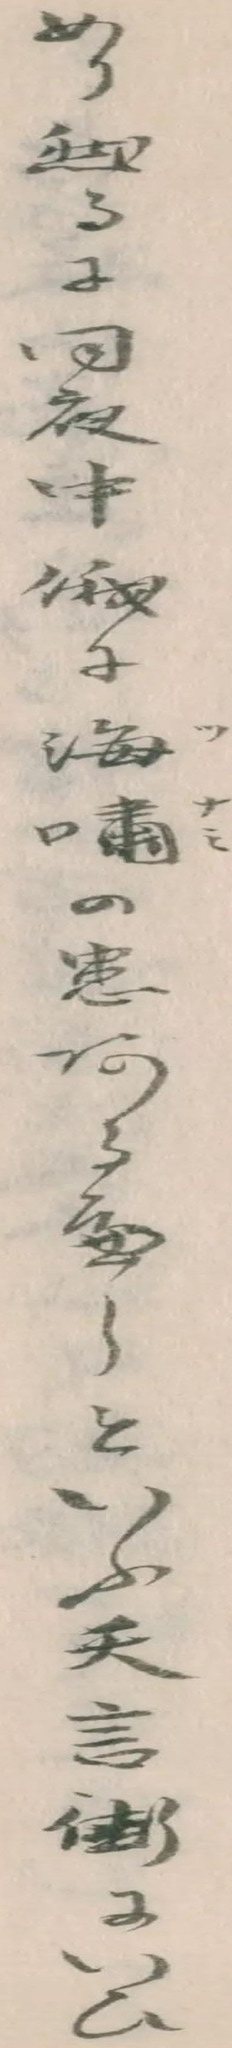めり然るに同夜中俄に海嘯の患あるへしといふ夭言街にいひ
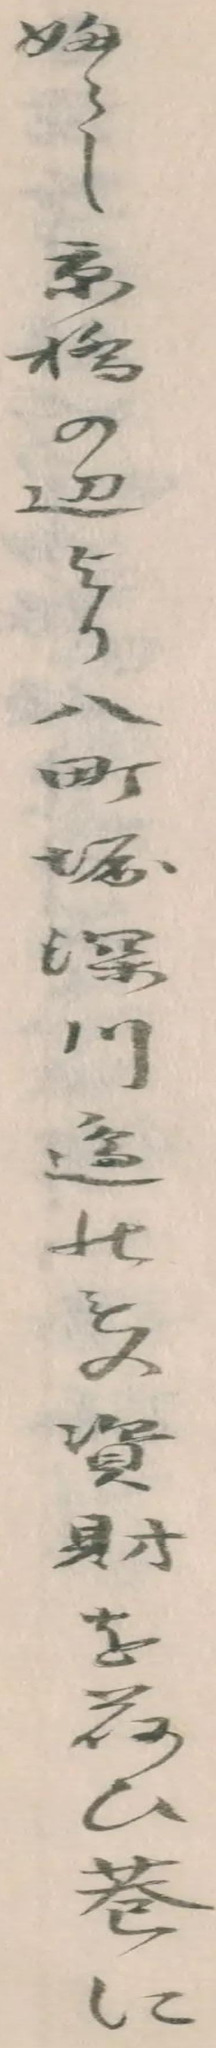ふらし京橋の辺より八町堀深川辺のもの資財を荷ひ巷に
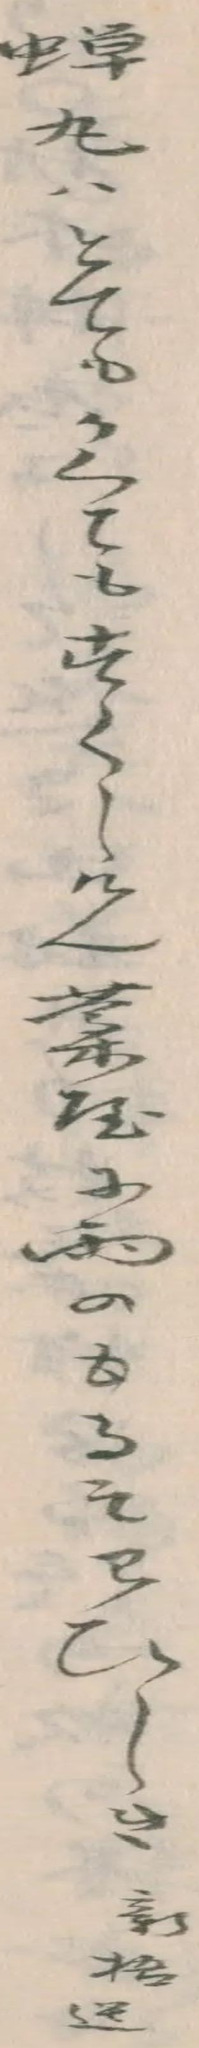蝉丸はとてもかくてもすくしけん藁屋に雨のもるそわひしき新梧選
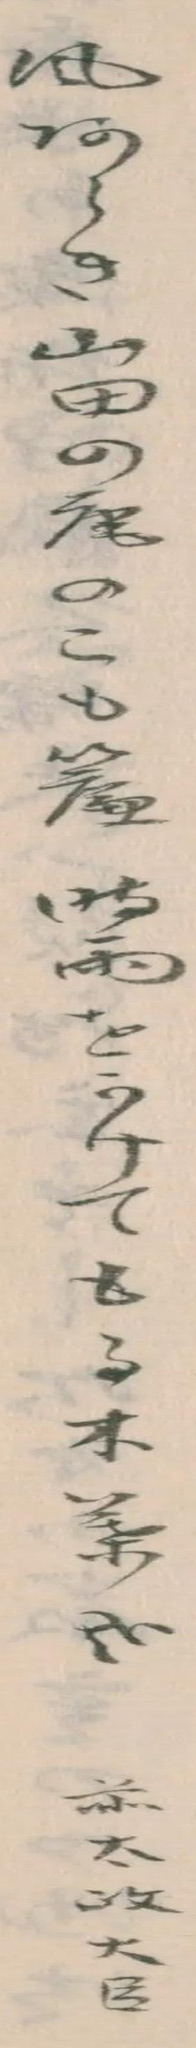風あらき山田の庵のこも簾時雨をかけてもる木葉哉前太政大臣
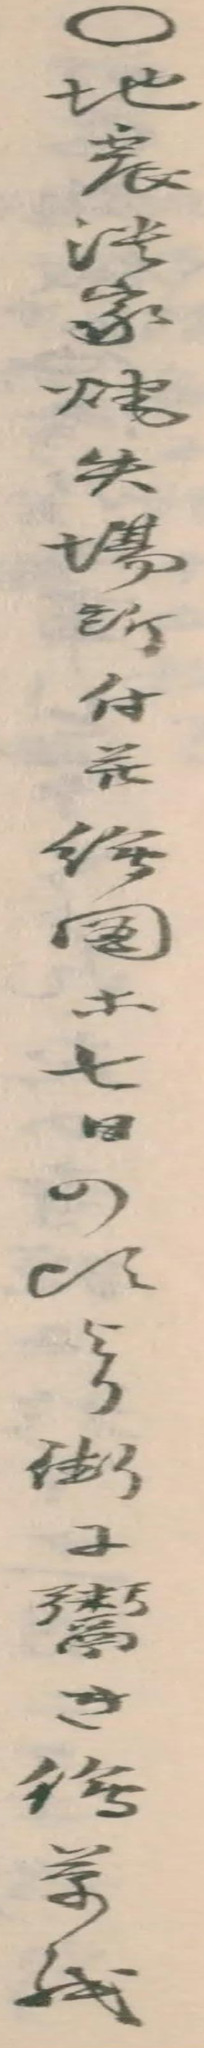〇地震潰家焼失場所付并絵図等七日の頃より街に鬻き絵草紙
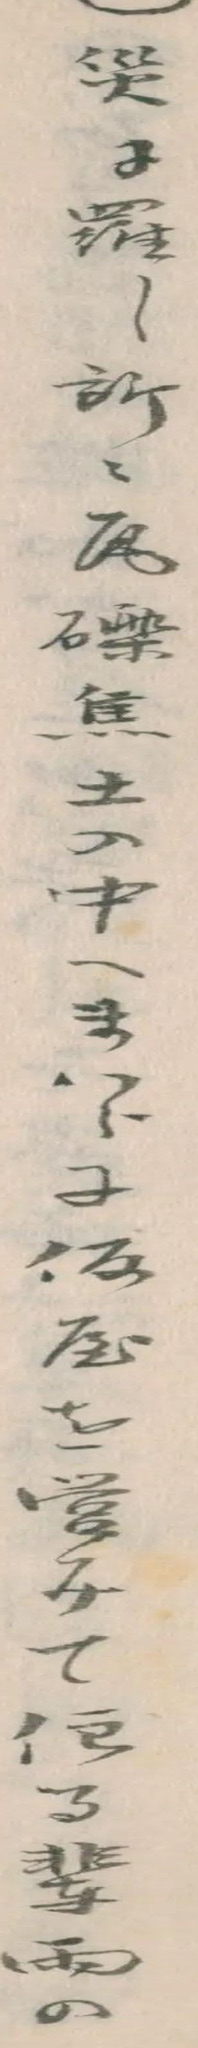〇災に罹し所々瓦礫焦土の中へまはらに仮屋を営みて住る輩雨の
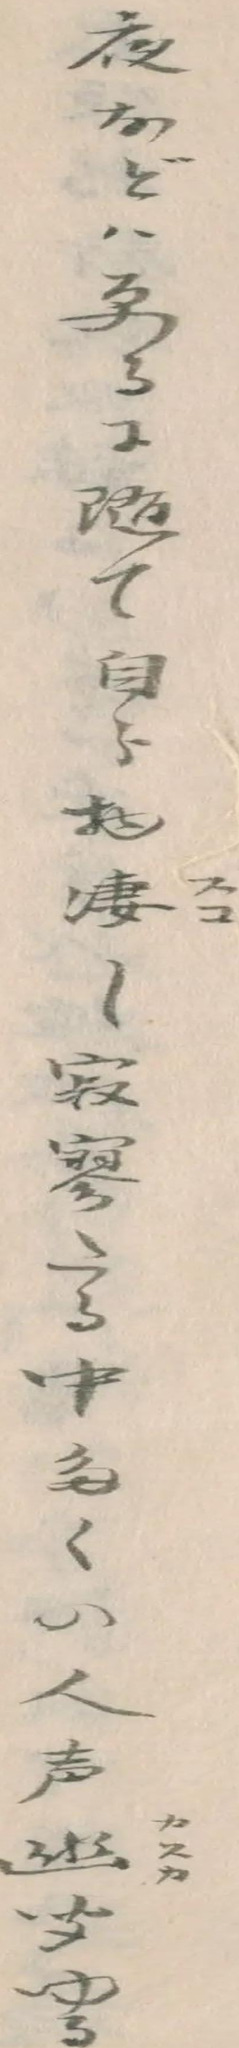夜などは更るに随いて自ら物凄し寂寥たる中多くの人声幽聞ゆる
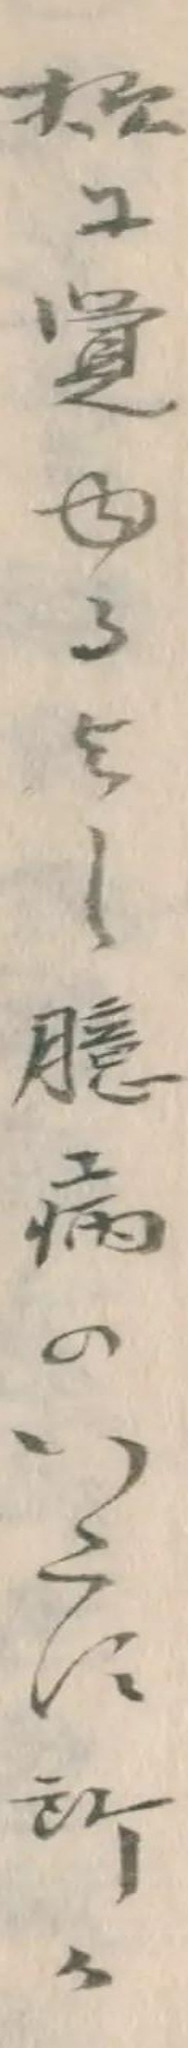様に覚ゆるよし臆病のいたす所々

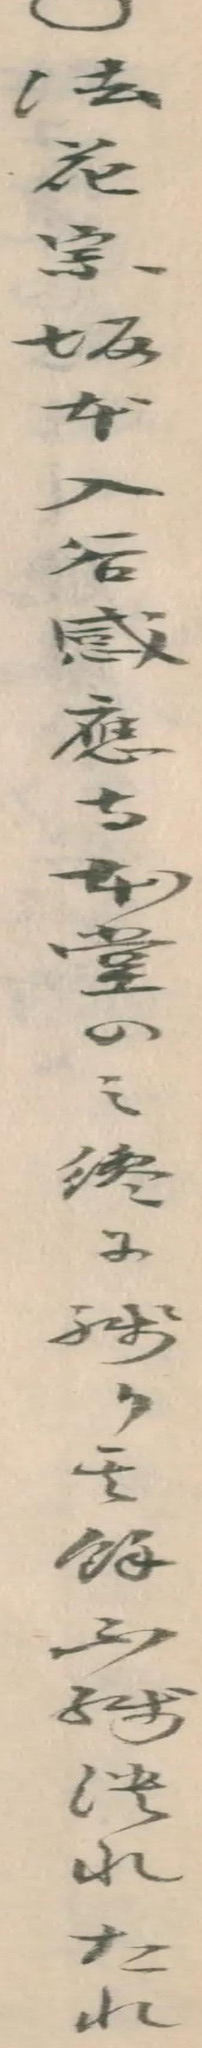〇法花宗坂本入谷感応寺本堂のみ終に残り其余不残潰れたれ
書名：地災撮要. 巻7-9(地震之部)
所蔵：国立国会図書館 National Diet Library, JAPAN
